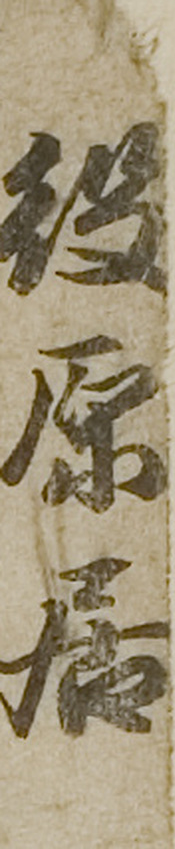役原居
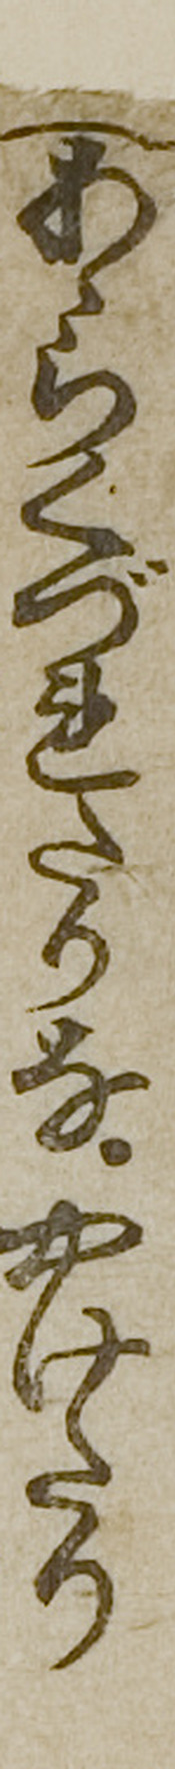｢あゝらくづれたりな．やけたり
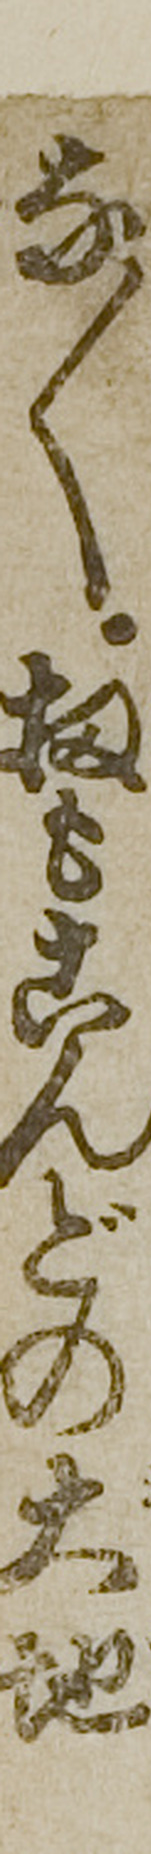な〳〵．扨もこんどの大地
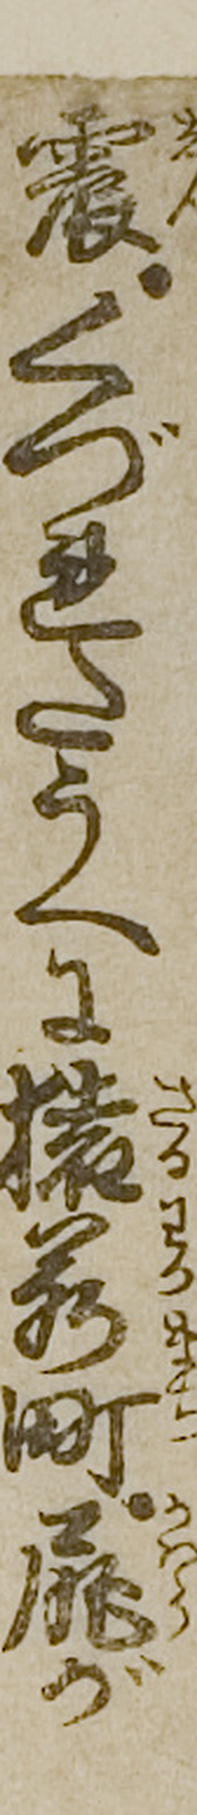震．くずれたうへに猿若町．瓦が
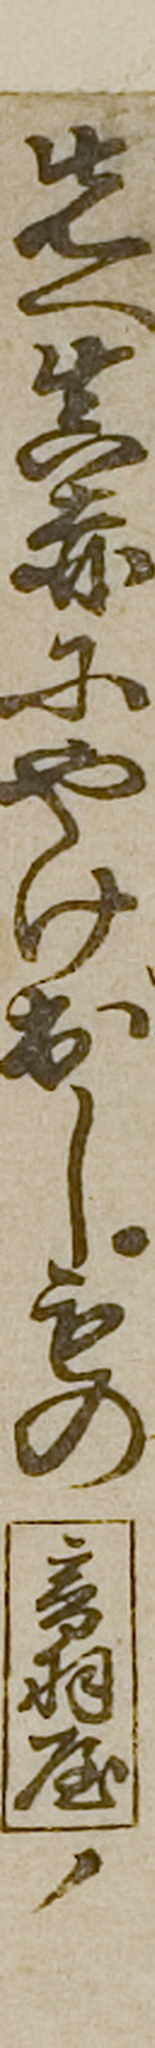先へ真赤にやけ出し．もの音羽屋．
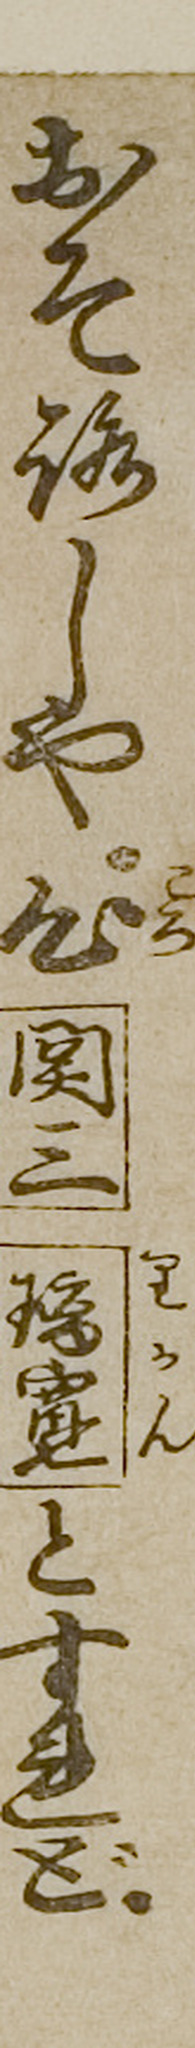おそろしや．心関三璃寛とすれど．
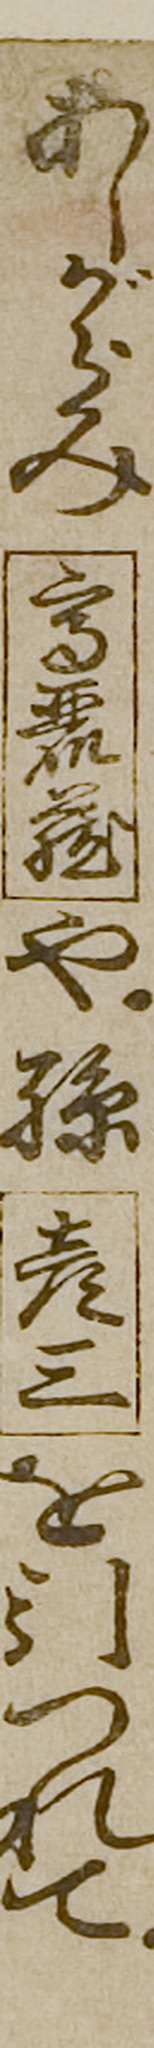あしがらみ高麗蔵や．孫彦三を引きつれて．
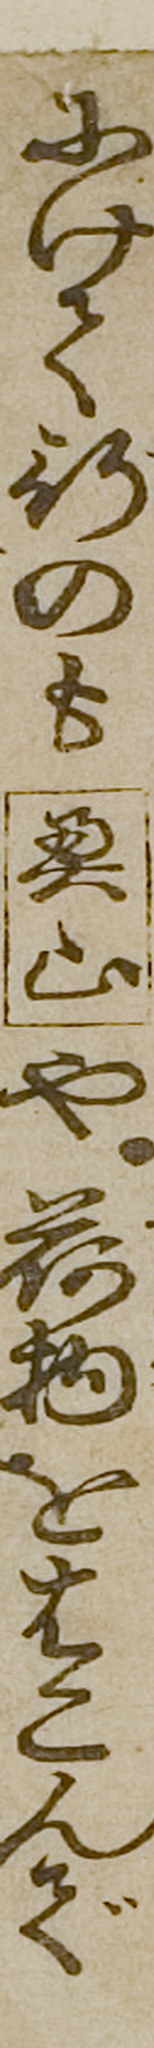にげて行のも奥山や．荷物をはこんで
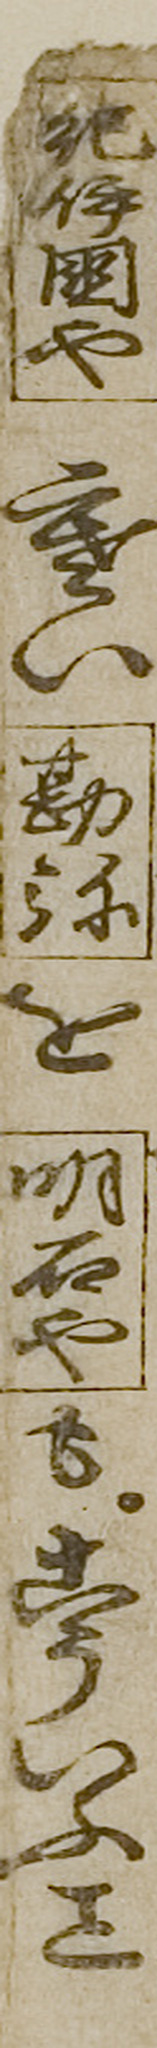紀伊国や．寒い勘彌を明石やも．こういふこと
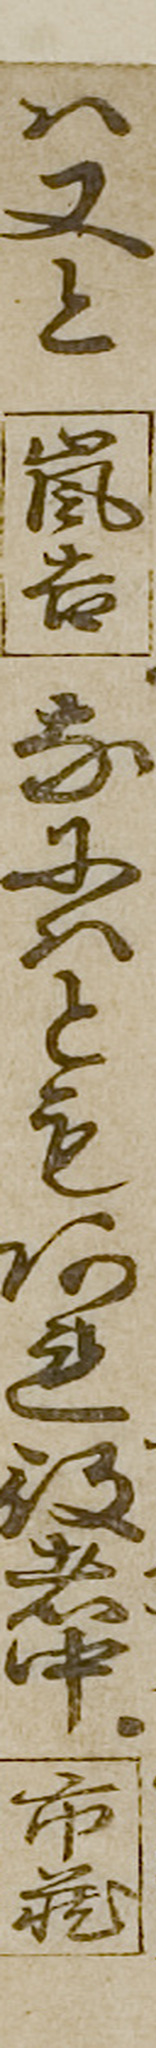は又と嵐吉．なにはともあれ役者中．市蔵
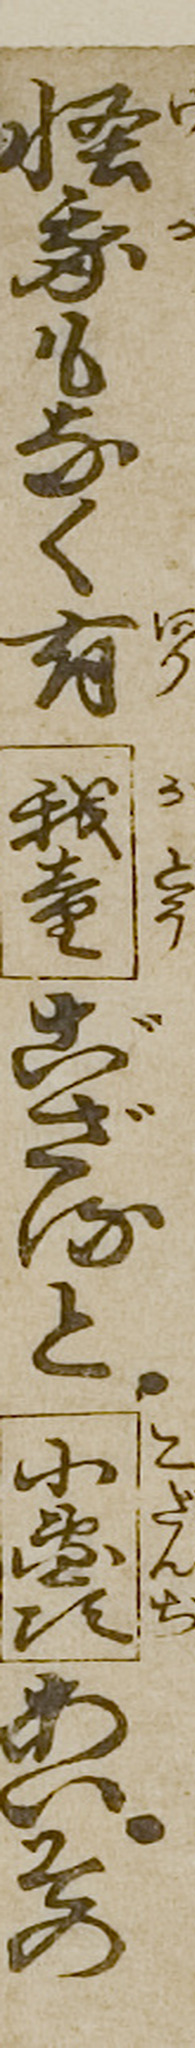怪我もなく有我童ござると．小団次あい．その
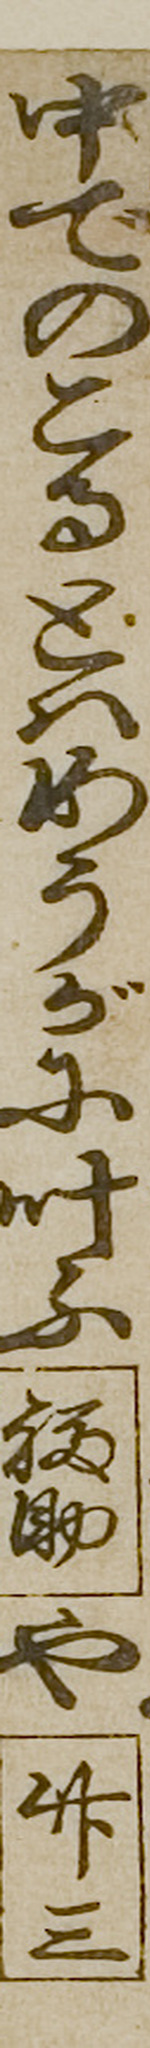中でのこるとはめうがに叶ふ福助や．竹三
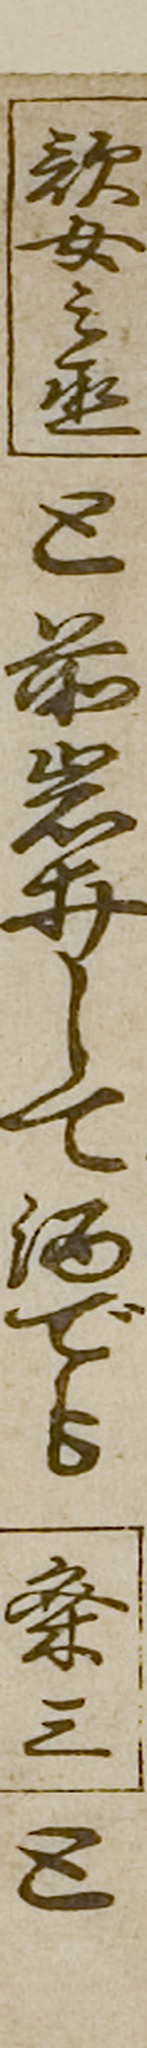歌女之丞と前岩井して．酒でも粂三と
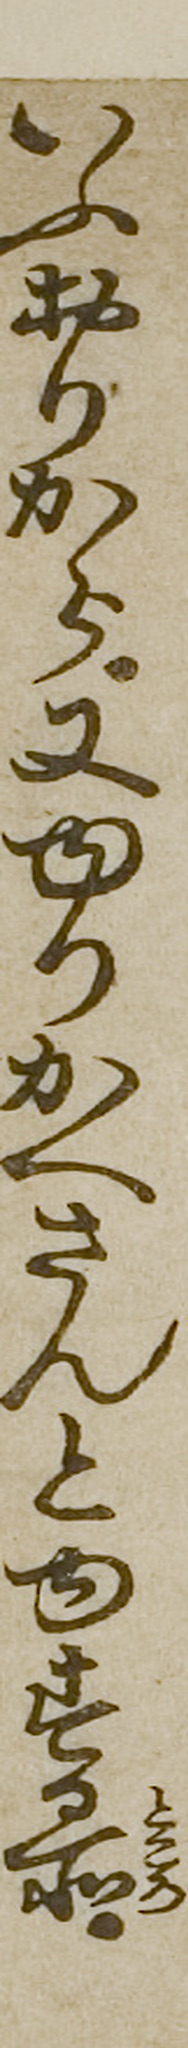いふおりから．又ゆりかへさんとゆする所．
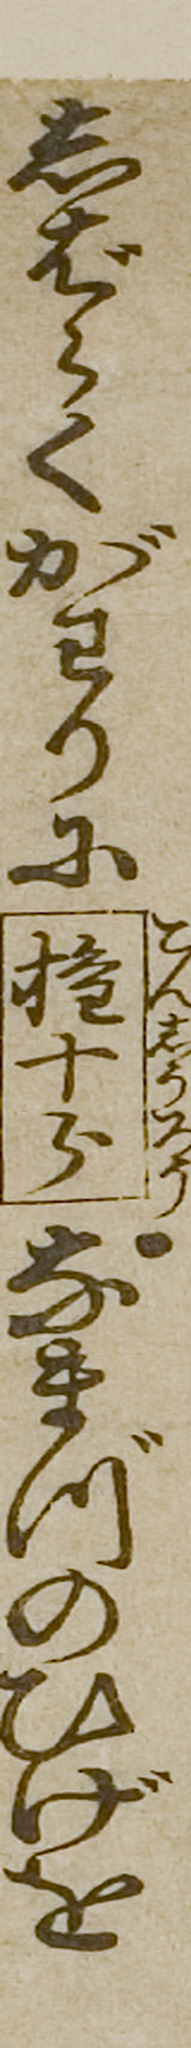しばらくがわりに権十郎．なまづのひげを
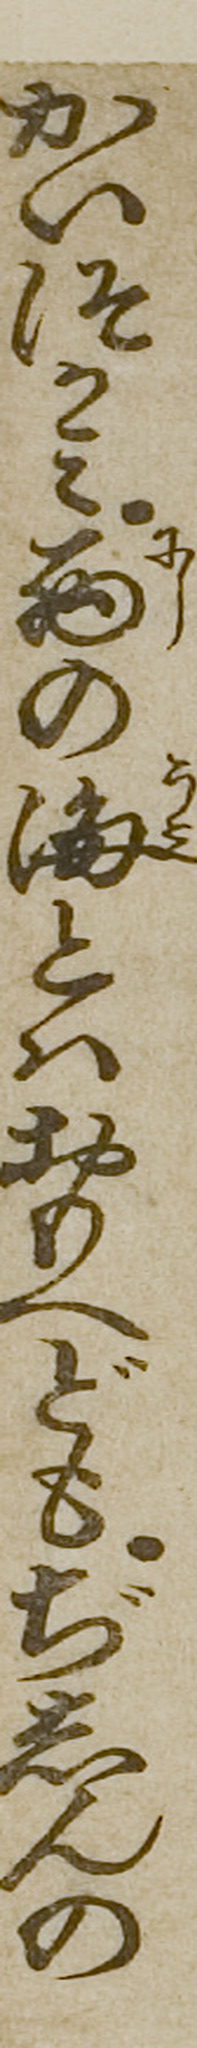かいつかみ．西の海とはおもへども．ぢしんの
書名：役原居
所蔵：東京大学総合図書館 General Library in the University of Tokyo, JAPAN
